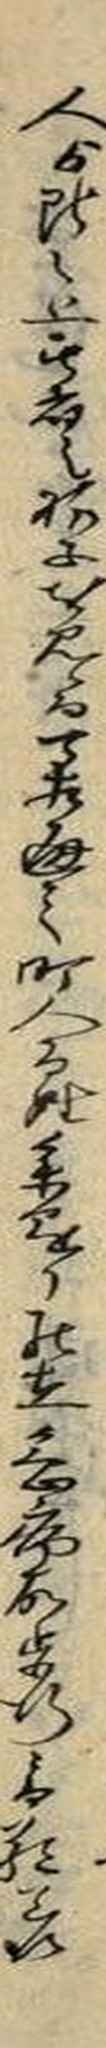人ゟ断之上其者之様子を見候而可相通之町人百姓参懸り罷在急病故歩行ニ而難差
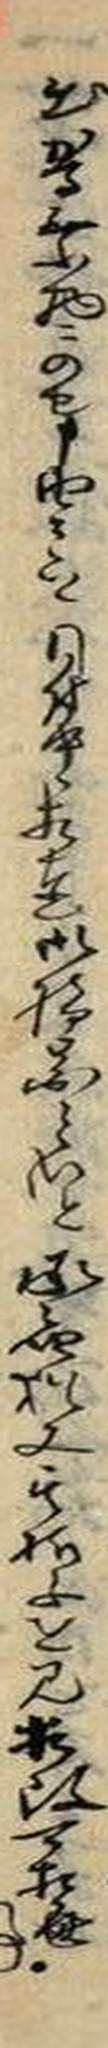出駕乗物ニのせ申由ニ候ハヽ目付中へ相達御指図ニ候哉と承届猶又其様子を見相改可相通事

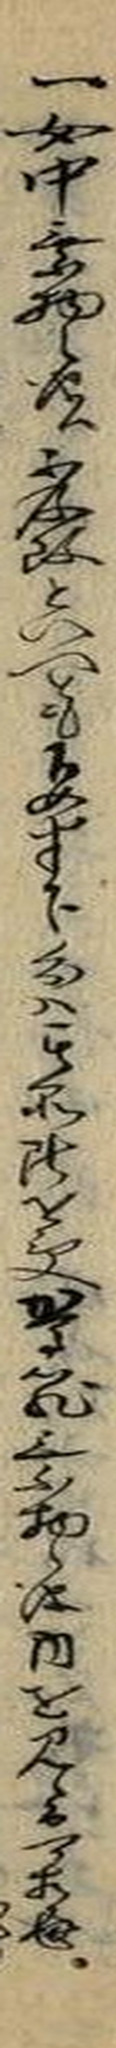一女中乗物之儀ハ不及改といへとも下女半下分ハ其品断を受駕籠乗物之儀内を見候而可相通事
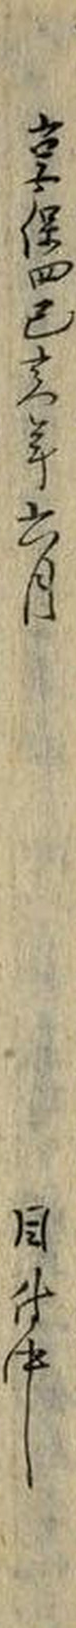享保四己亥年六月目付中
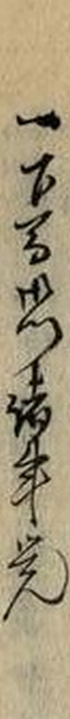一下馬御門諸事覚
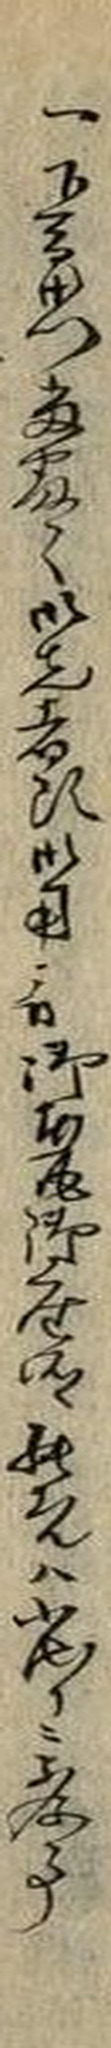一下馬御門当番之御先者頭御用ニ付御本丸御座所へ罷出候ハ小代りニ不及事
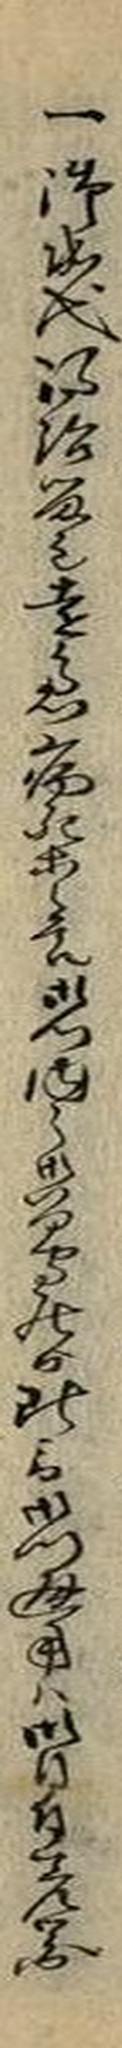一御城代湯治留主遠慮病死等之節御門内之御留守居ゟ断ニ而御門通用ハ御目付差図
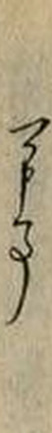可申事
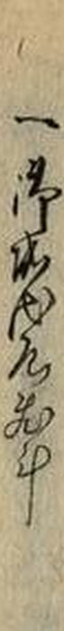一御城代屋敷斗
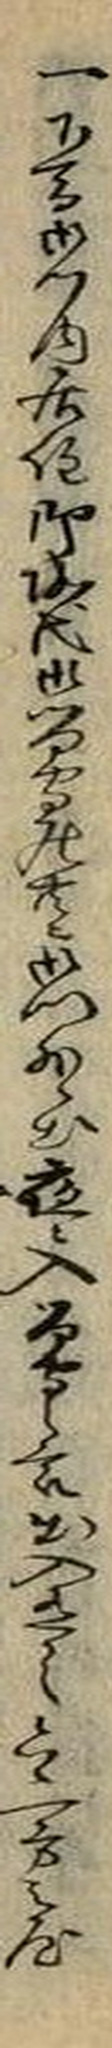一下馬御門内居住御城代御留守居共ニ御門外へ出夜ニ入留守之節出入有之候ハヽ一方之屋
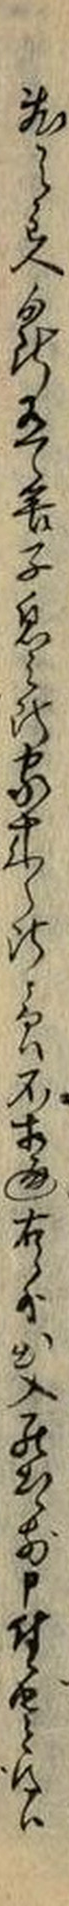敷之主人ゟ断有之筈子息之断家来之断ニ而ハ不相通右之外出入罷出候前申付候由ニ候得ハ
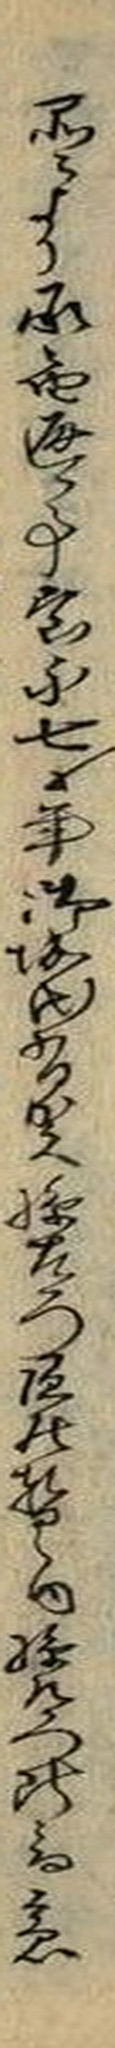品ニより承届通候事宝永七寅年御城代有賀孫左衛門隠居暫之内孫左衛門断ニ而急
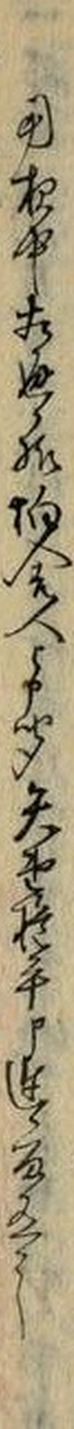用夜中相通候様狛舎人被申聞矢野権平申達候留有之
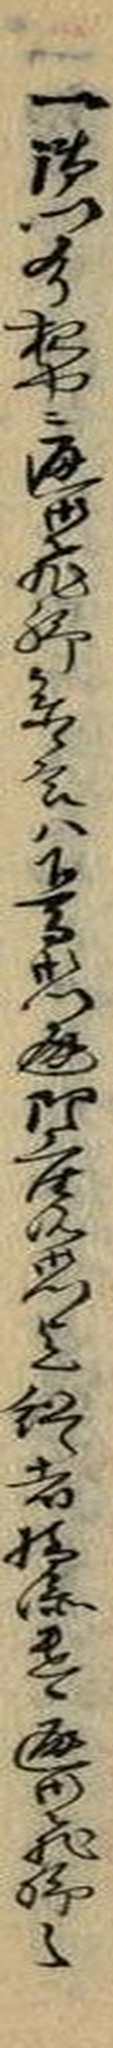一御門〆り夜中ニ通御飛脚参候節ハ下馬御門通御座所御門迄組之者指添遣候通御飛脚之
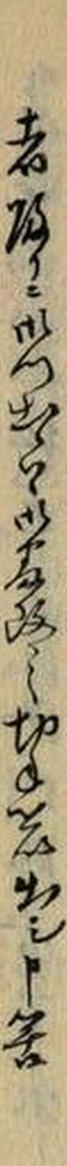者帰りニ御門出候ハヽ御番改之切手を以出シ申筈
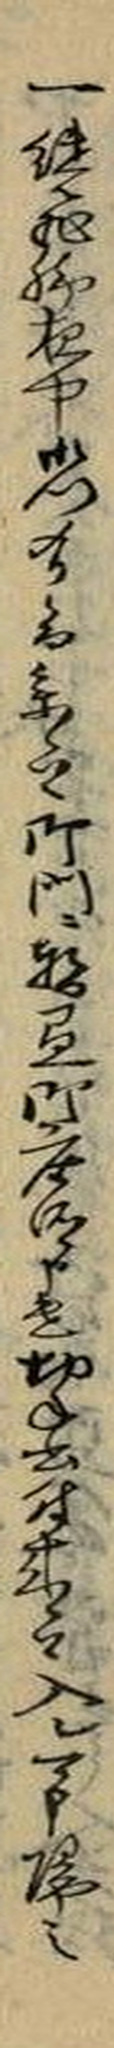一継飛脚夜中御門〆りニ而参候ハヽ御門ニ暫置御座所へ申遣切手書付来候ハヽ入可申帰之
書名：御門御櫓之部
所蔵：福井県文書館 Fukui Prefectural Archives
